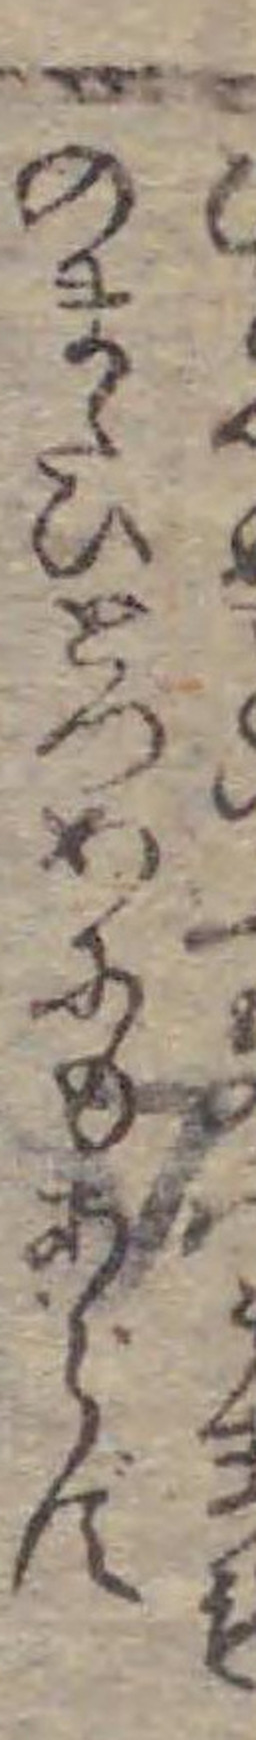のまゝひとつめにもあらず
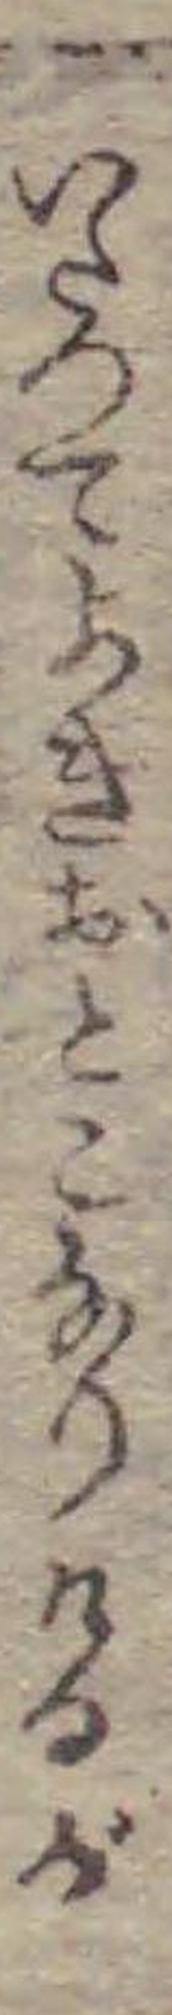いたつてよきおとこなりけるが
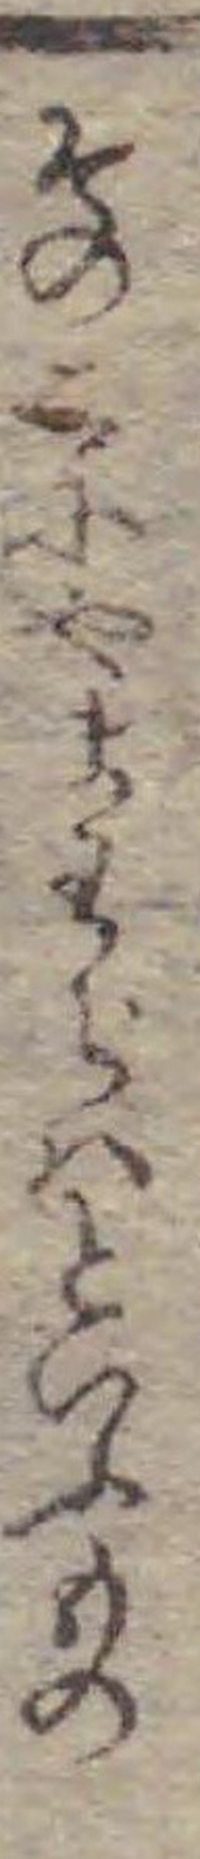そのこにやまわらはといふもの
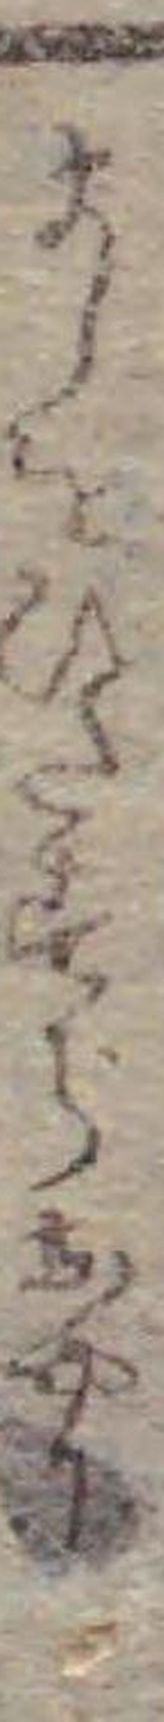よしをひたすらおやに
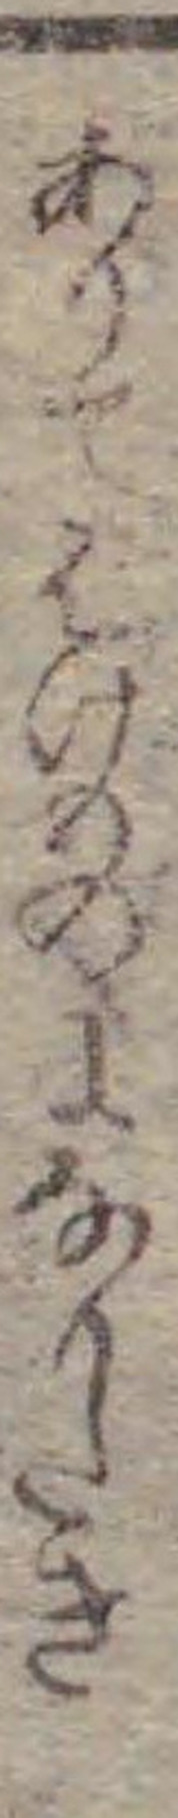ありてはけものになりたき
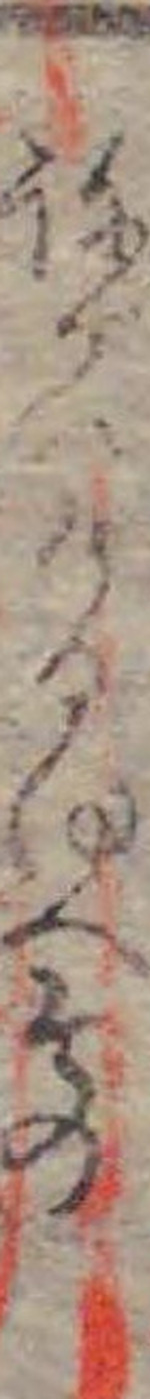ねがいけるゆへその
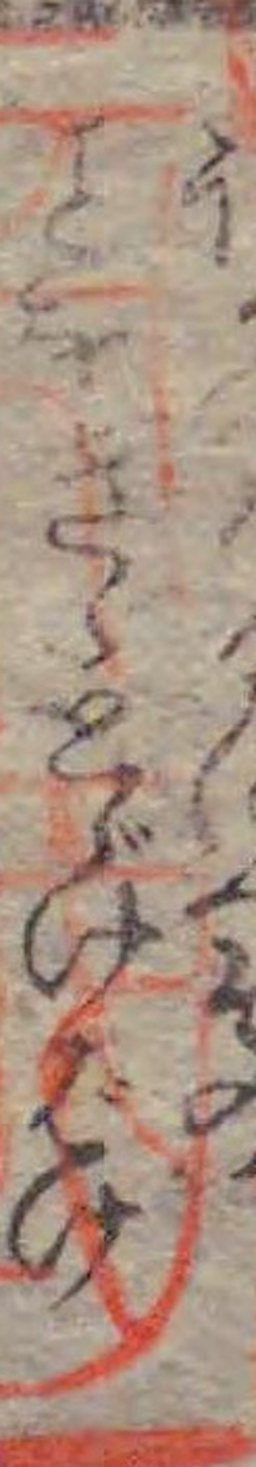ことをきゝとどけばけ
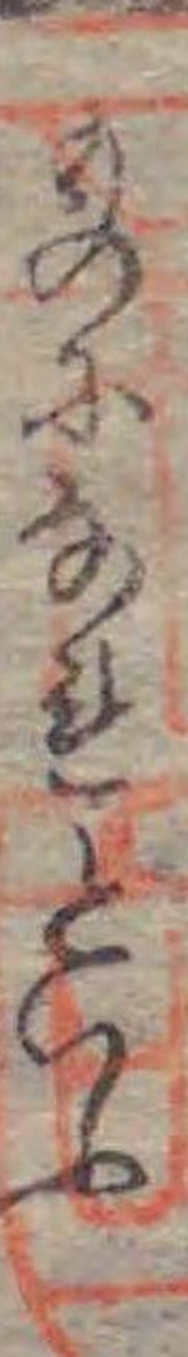ものになれといふ
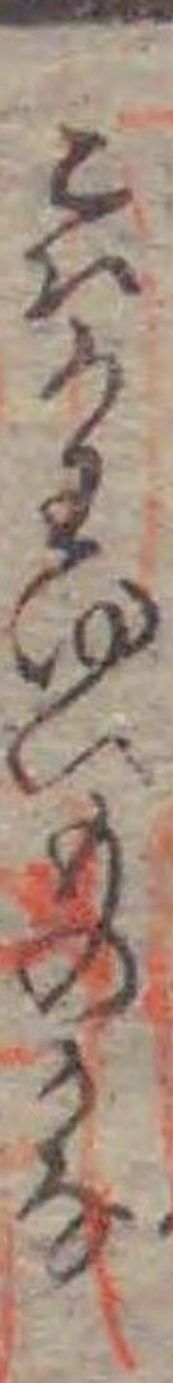こはかわゆいものかな
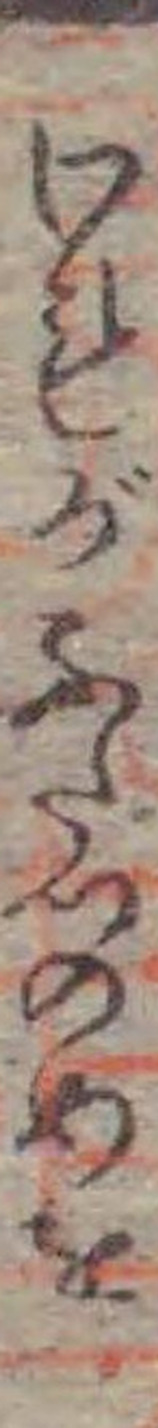われがふたつのめを
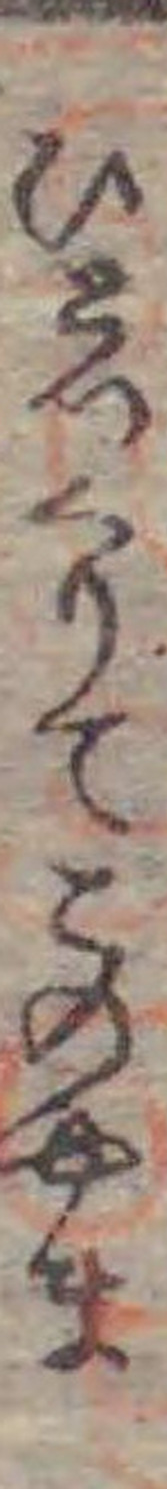ひとつくりてこのやま
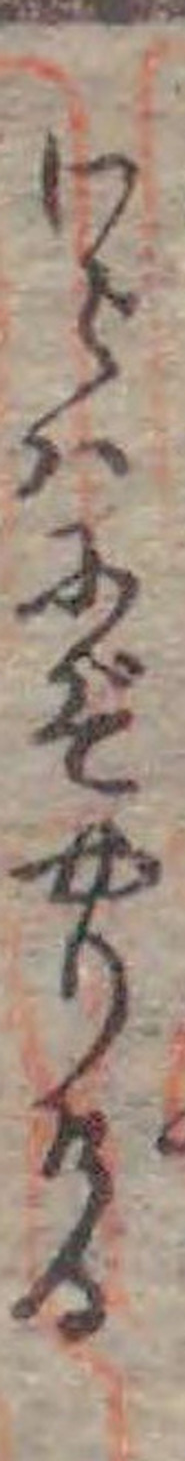わらはにぞやりける
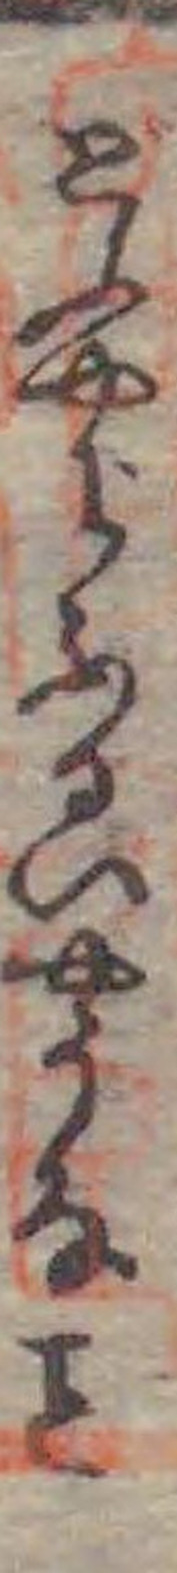とふやらふるやうなこと

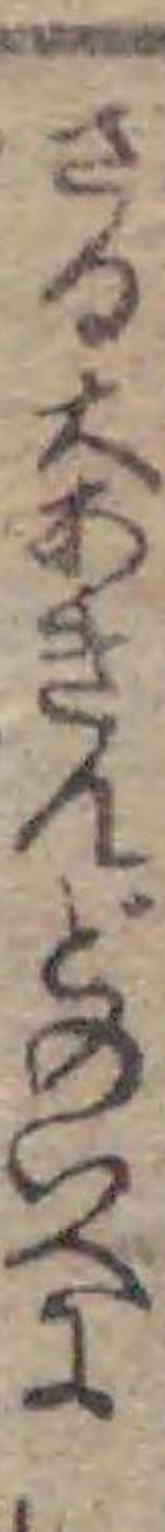さる大あきんどのいへに
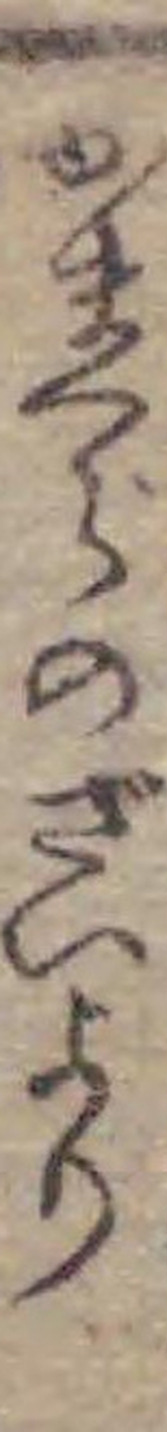かまくらのざいより
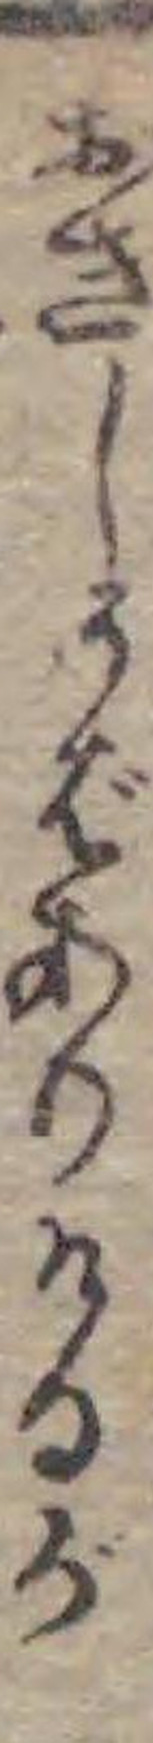おきしうばありけるが
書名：変化物春遊 : 2巻
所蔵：国立国会図書館 National Diet Library, JAPAN
